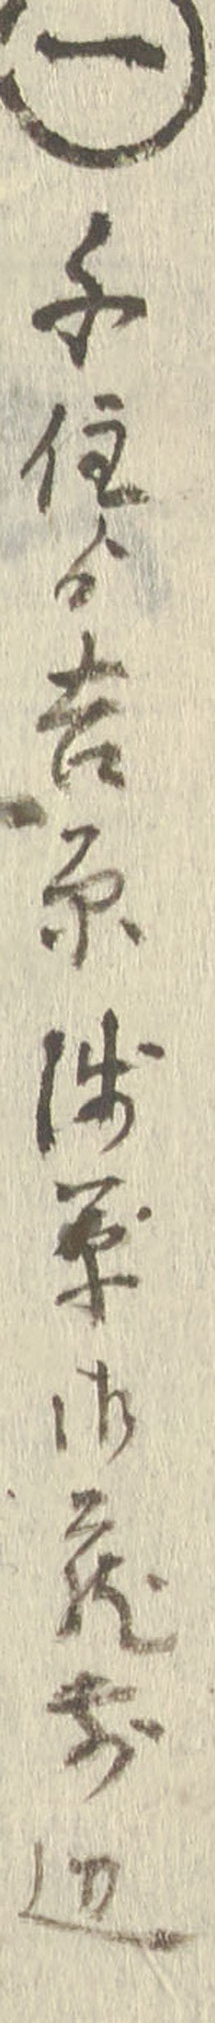一千住ゟ吉原浅草御蔵前辺
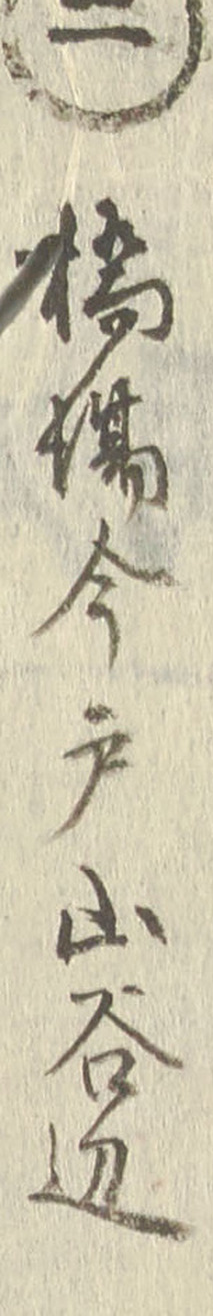二橋場今戸山谷辺
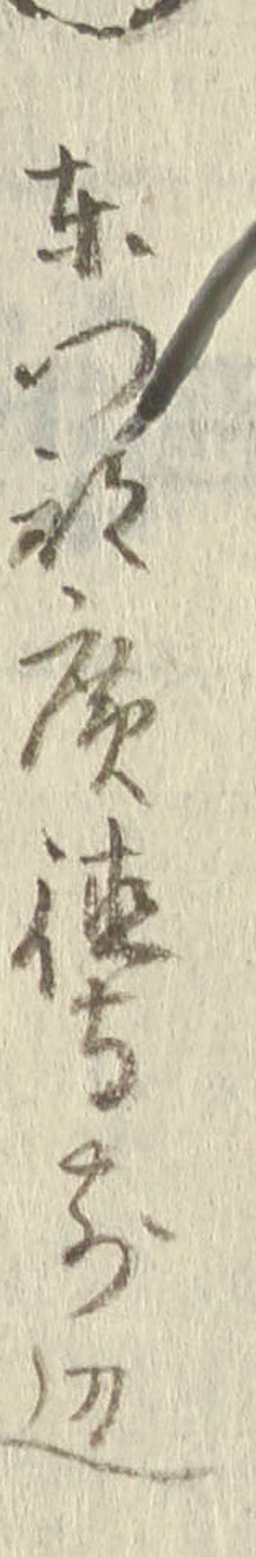三東門跡廣徳寺前辺
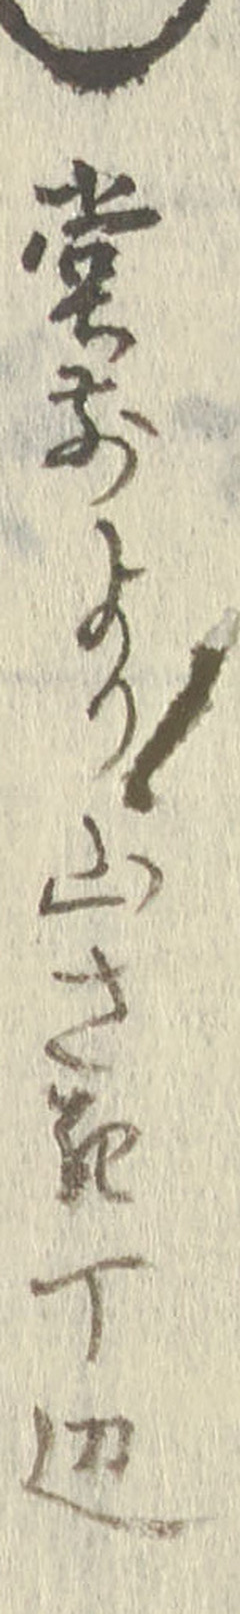四堂前より山さき丁辺
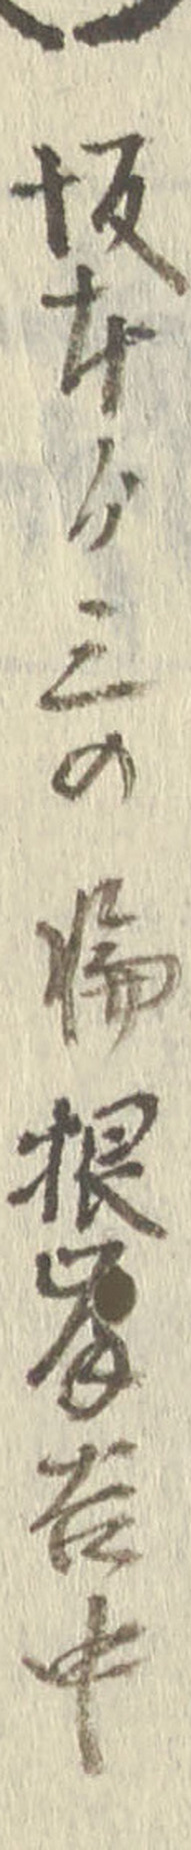五坂本ゟ三の輪根岸谷中
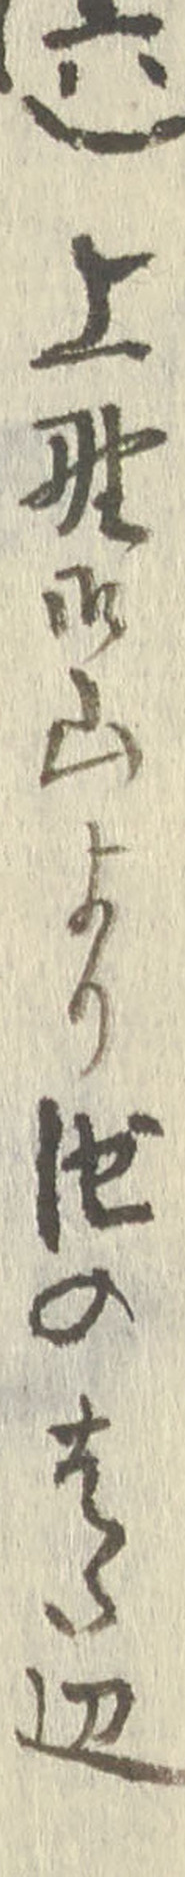六上野御山より池のはた辺
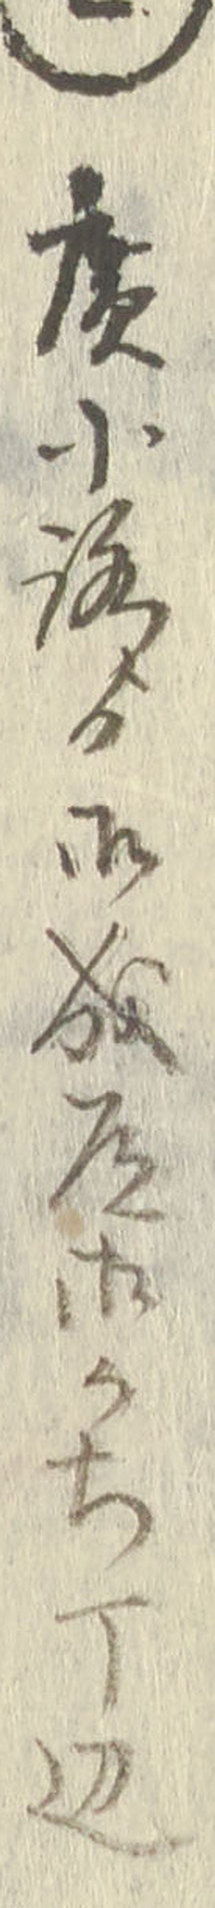七廣小路ゟ御成道御かち丁辺
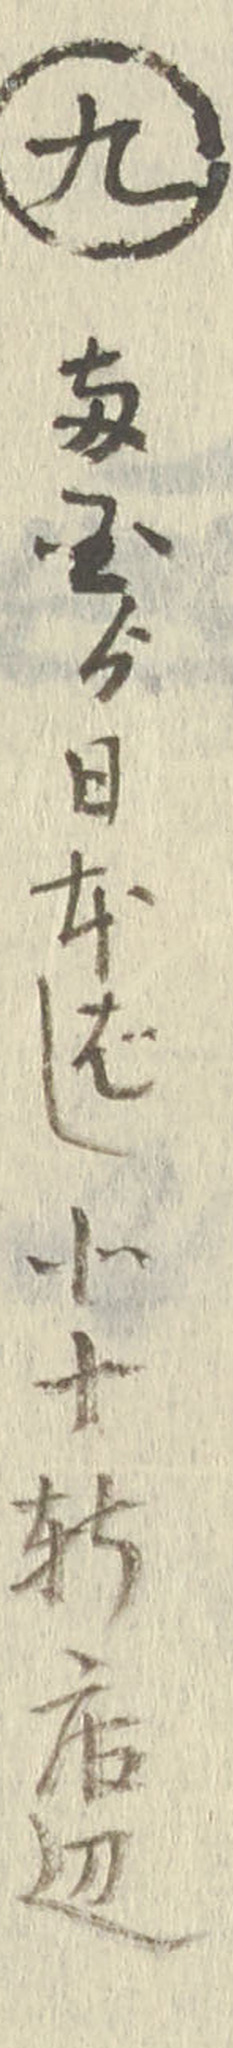九両国ゟ日本ばし北十軒店辺
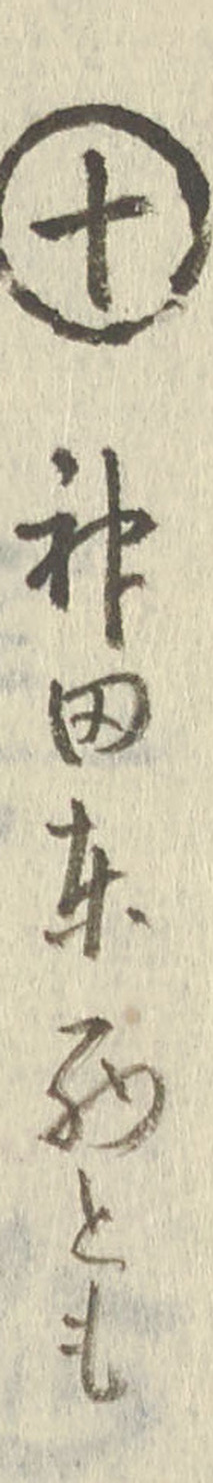十神田東西とも
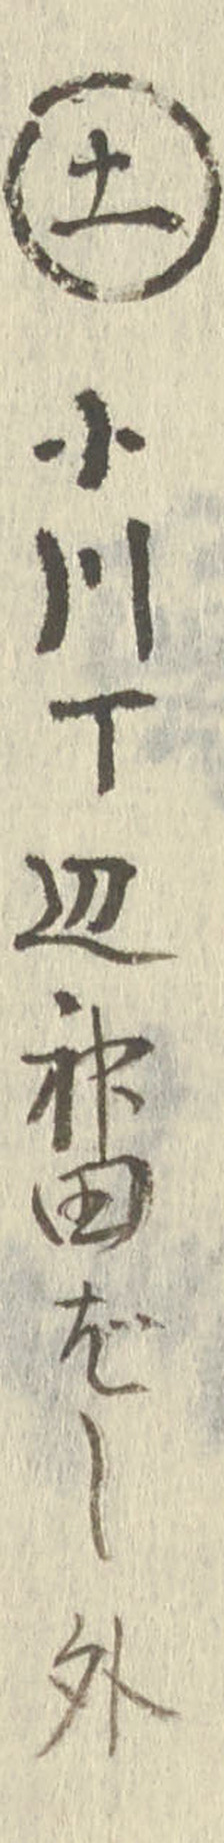十一小川丁辺神田ばし外
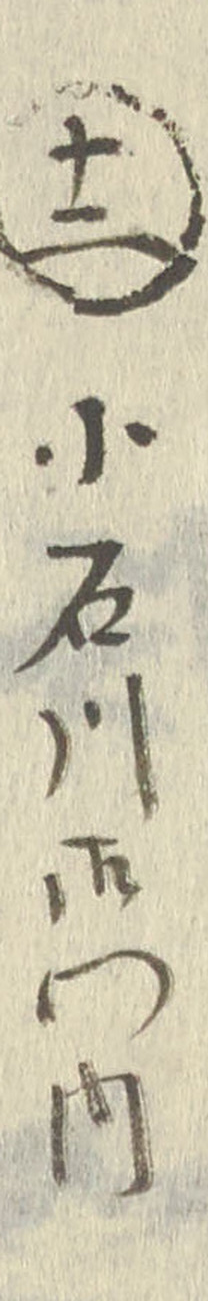十二小石川御門内
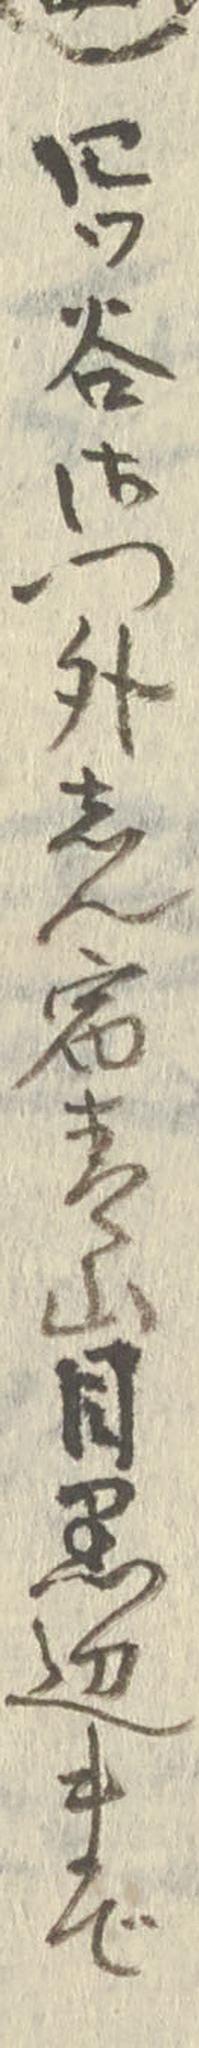十四四ツ谷御門外しん宿青山目黒辺まで
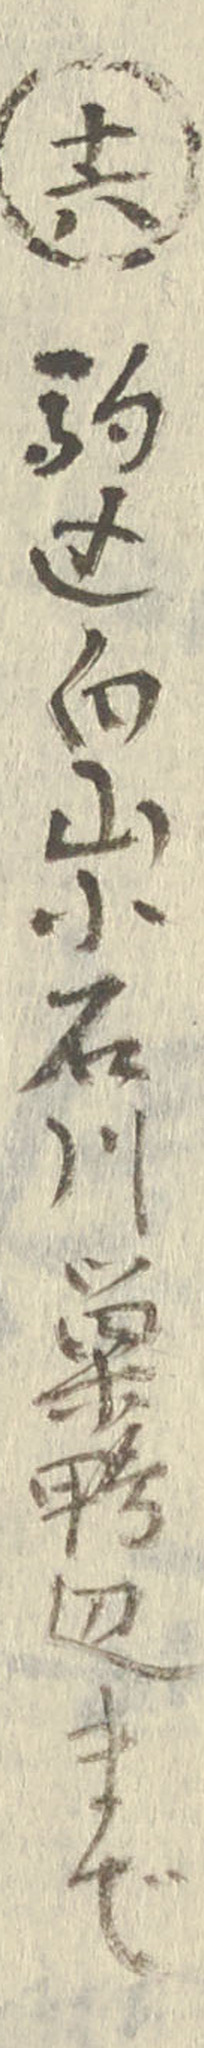十六駒込白山小石川巣鴨辺まで
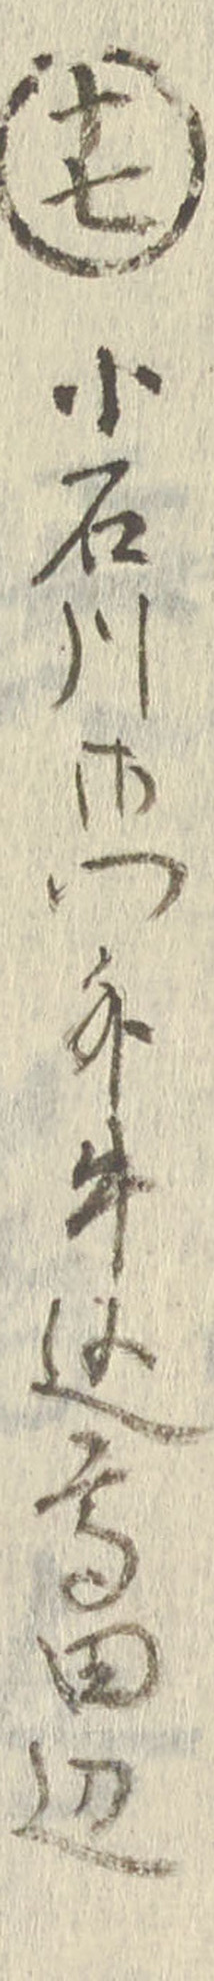十七小石川御門外牛込高田辺
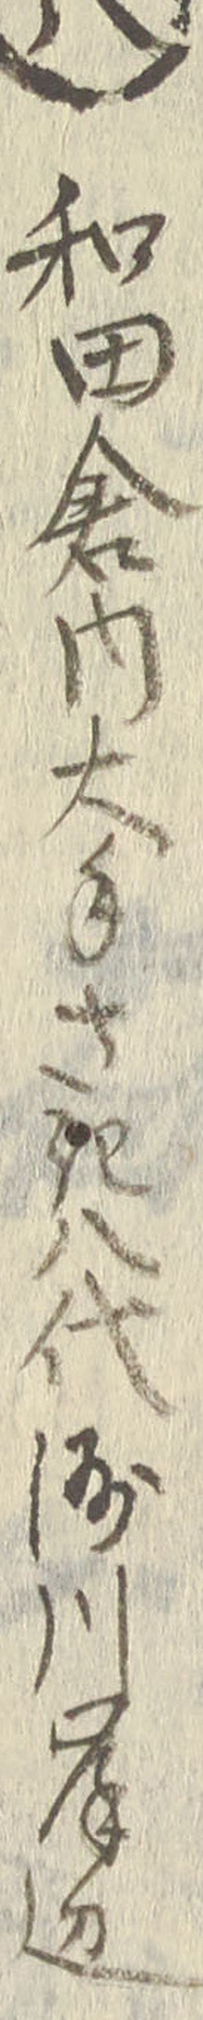十八和田倉内大手さき八代洲川岸辺
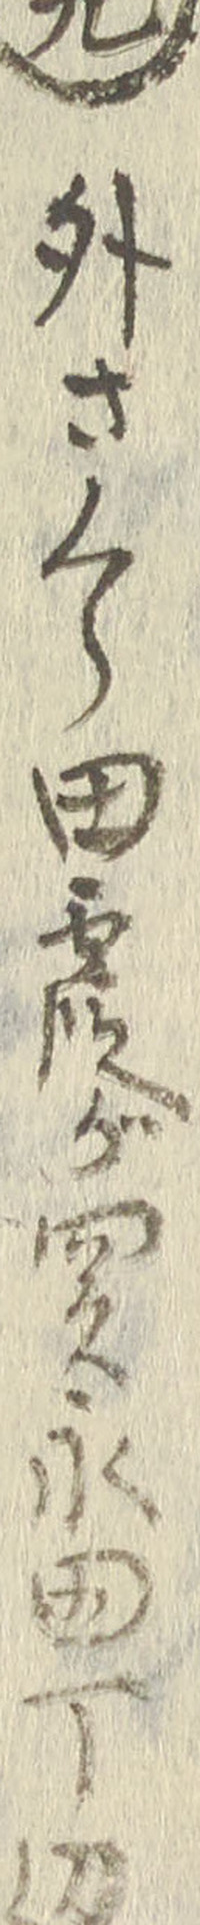十九外さくら田霞ヶ関永田丁辺
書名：御府内御屋敷方市中共地震類焼場所明細書之冩兼街道筋近郷聞書
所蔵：東京大学総合図書館 General Library in the University of Tokyo, JAPAN
